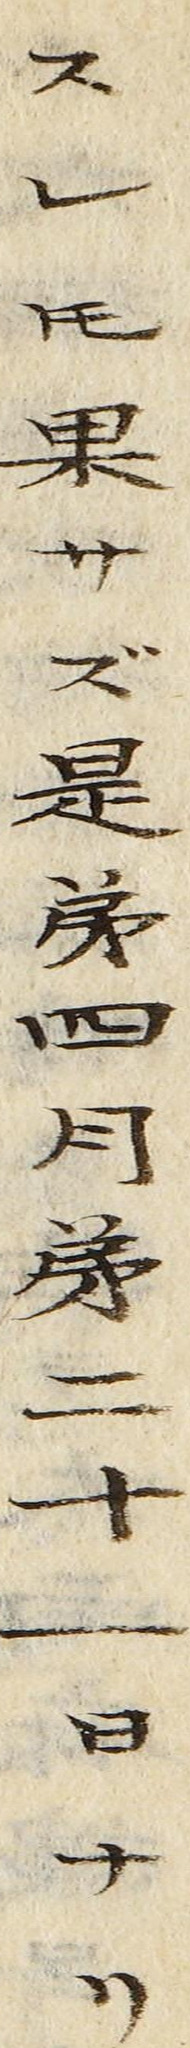スレトモ果サズ是第四月第二十一日ナリ
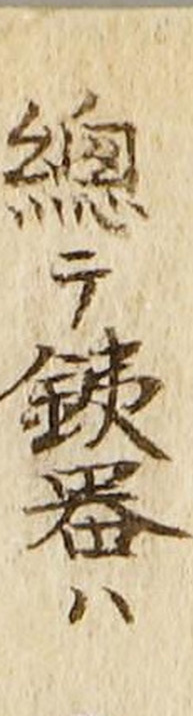総テ鉄器ハ
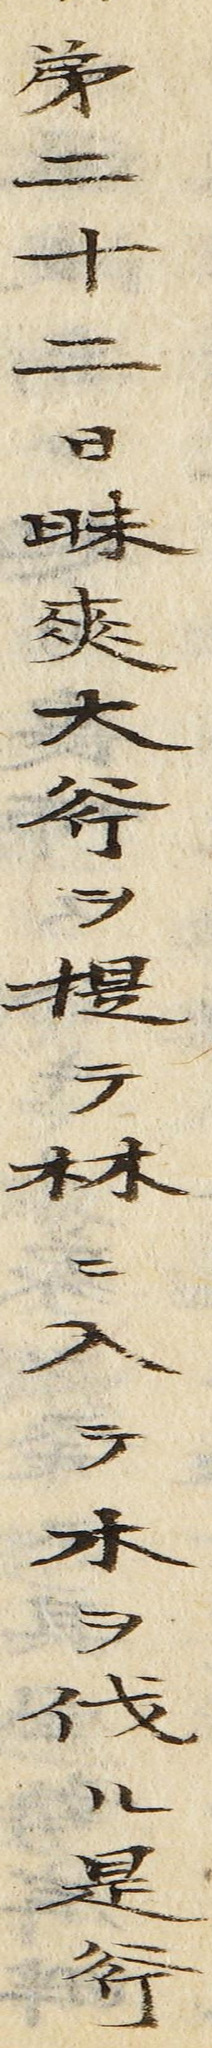第二十二日昧爽大斧ヲ提テ林ニ入テ木ヲ伐ル是斧
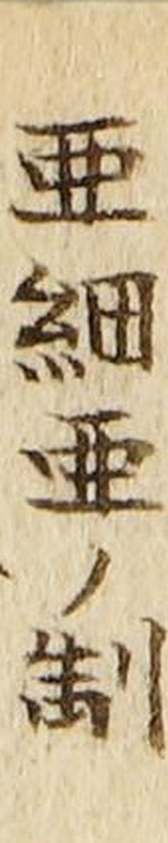亜細亜ノ制
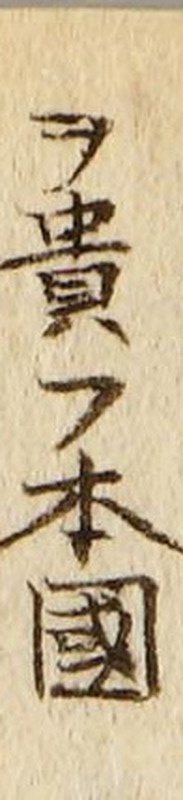ヲ貴フ本国
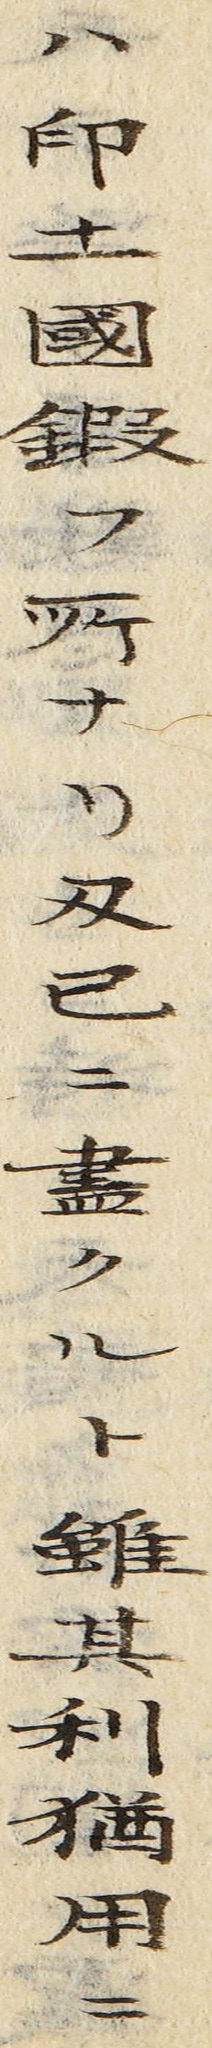ハ印土国鍛フ所ナリ刃已ニ尽クルト雖其利猶用ニ
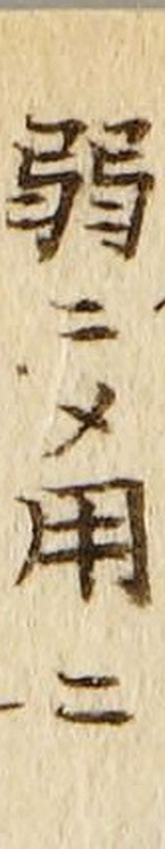弱ニシテ用ニ
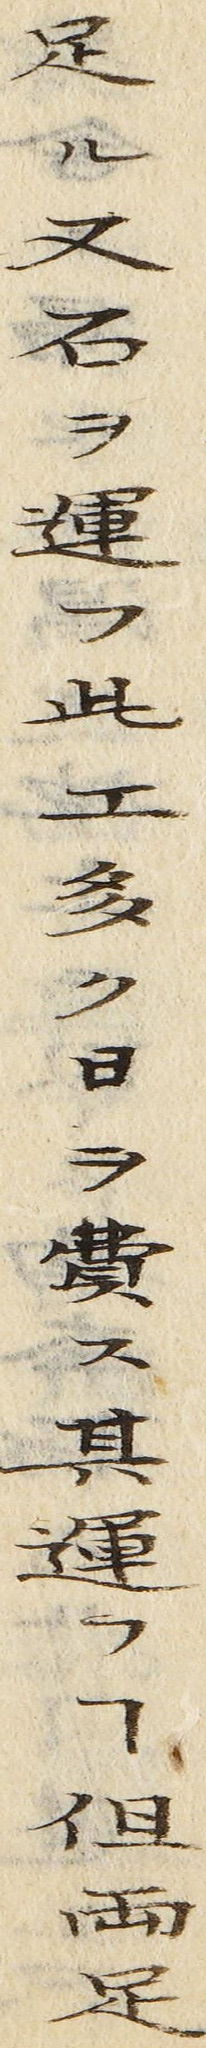足ル又石ヲ運フ此工多ク日ヲ費ス其運フコト但両足
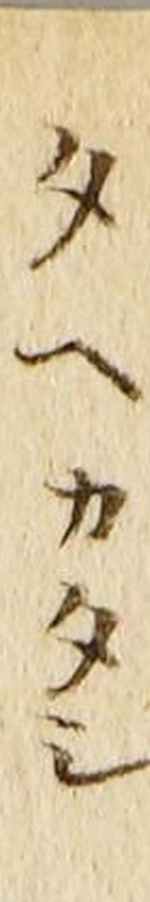タヘカタシ
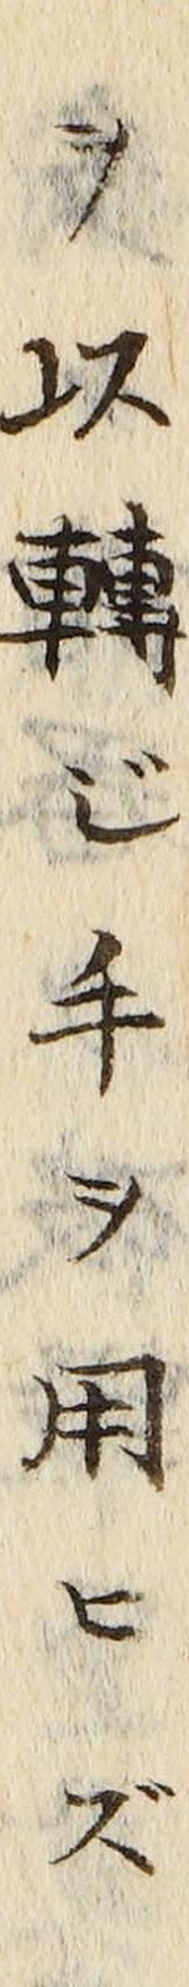ヲ以転ジ手ヲ用ヒズ
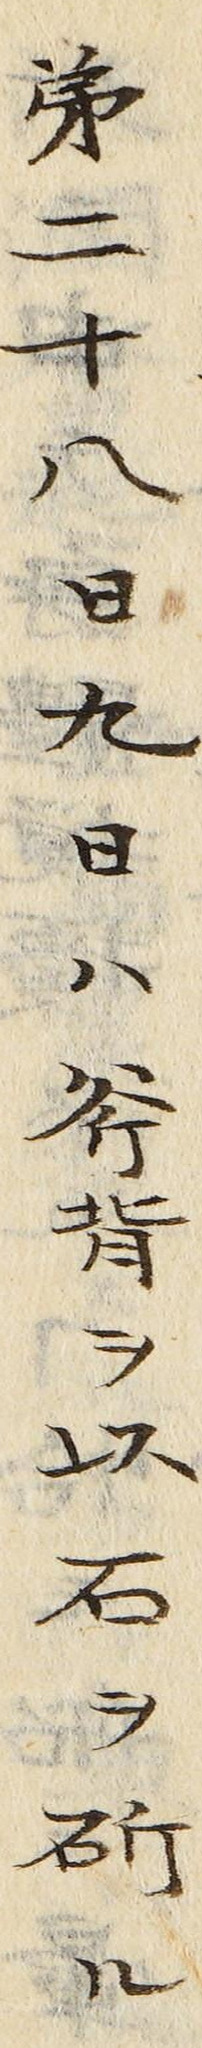第二十八日九日ハ斧背ヲ以石ヲ斫ル
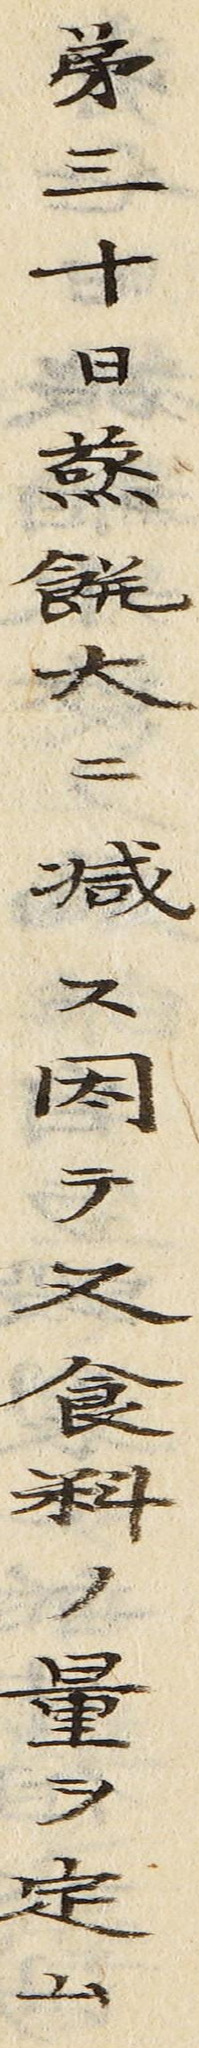第三十日蒸餅大ニ減ス因テ又食料ノ量ヲ定ム
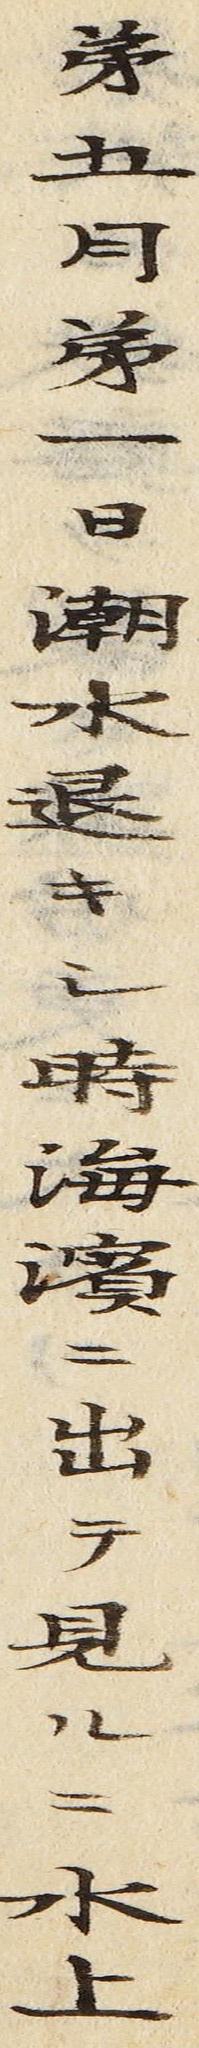第五月第一日潮水退キシ時海浜ニ出テ見ルニ水上
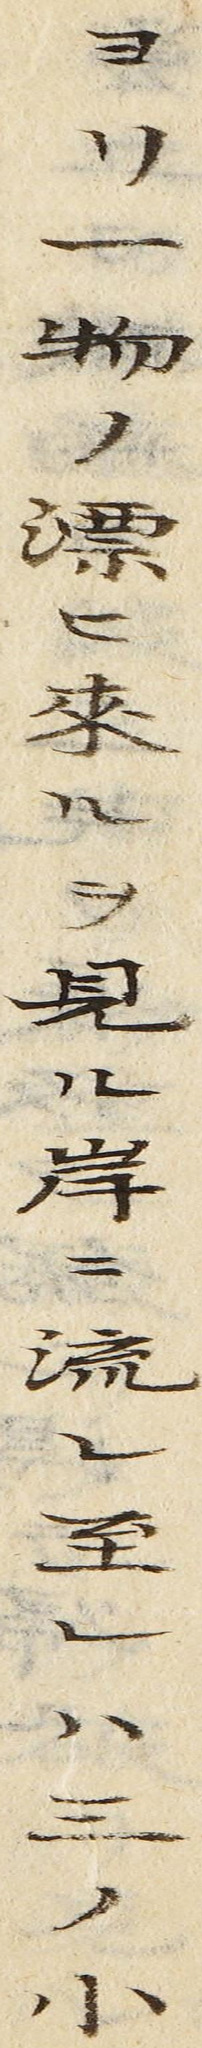ヨリ一物ノ漂ヒ来ルヲ見ル岸ニ流レ至レハ三ノ小
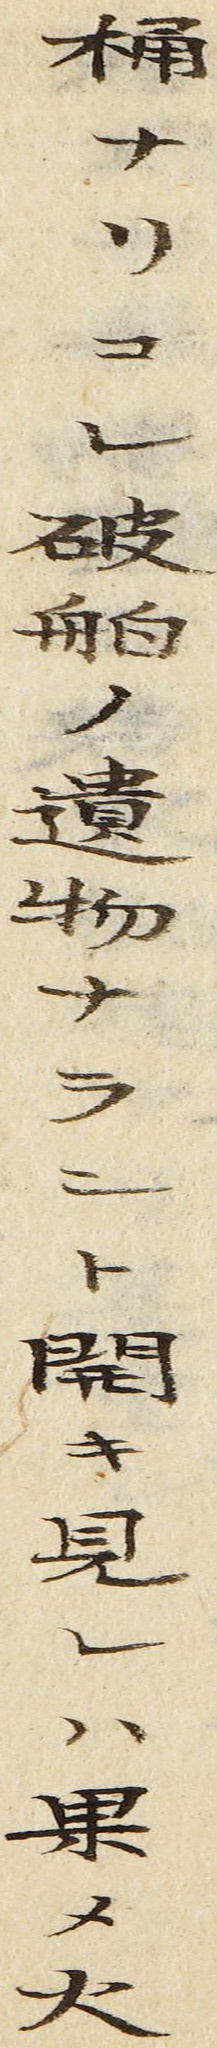桶ナリコレ破舶ノ遺物ナラント開キ見レハ果シテ火
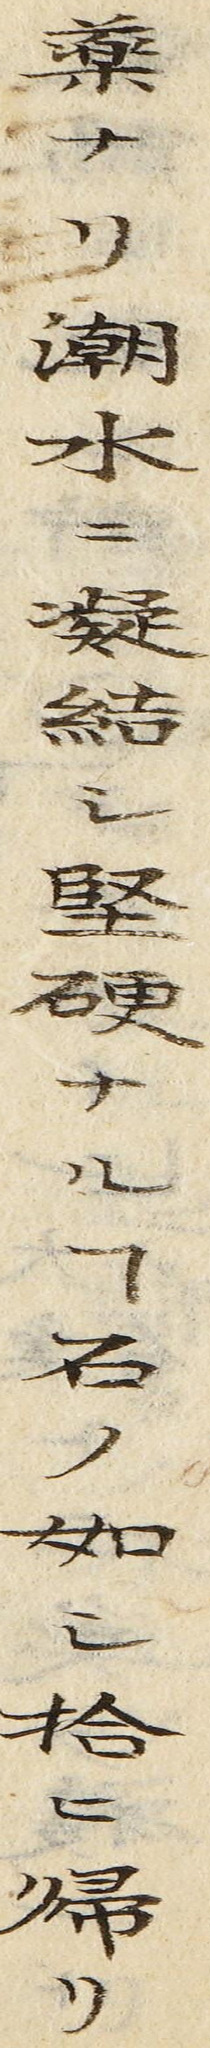薬ナリ潮水ニ凝結シ堅硬ナルコト石ノ如シ拾ヒ帰リ
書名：漂流紀事
